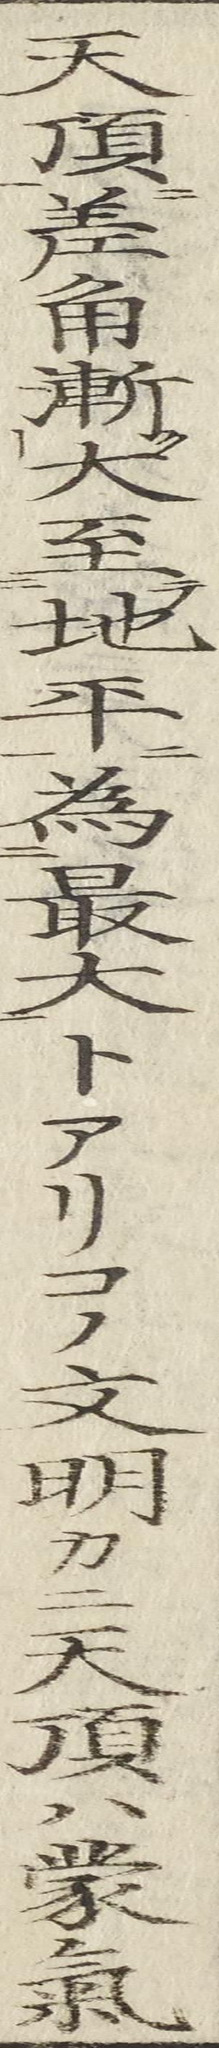天頂差角漸―大至ニ地平為ニ最大トアリコノ文明カニ天頂ハ豪気
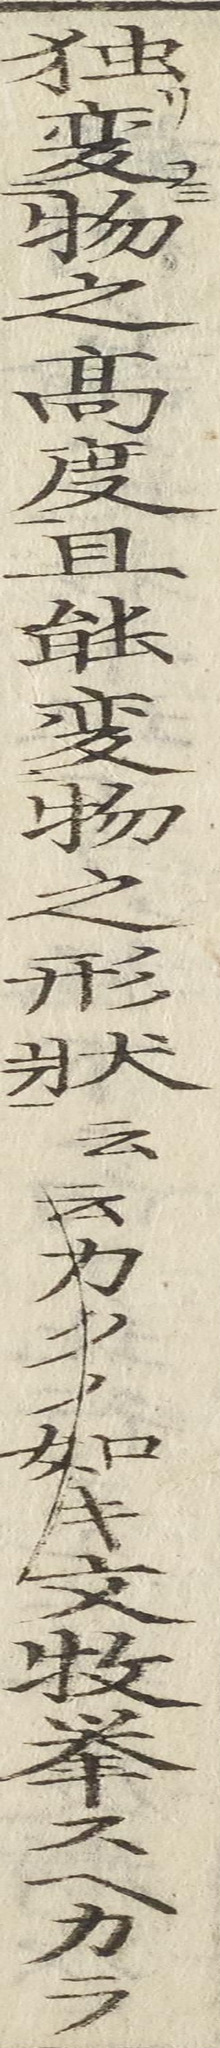独変ニ物之高度且能変ニ物之形状云云カクノ如キ文枚挙スヘカラ
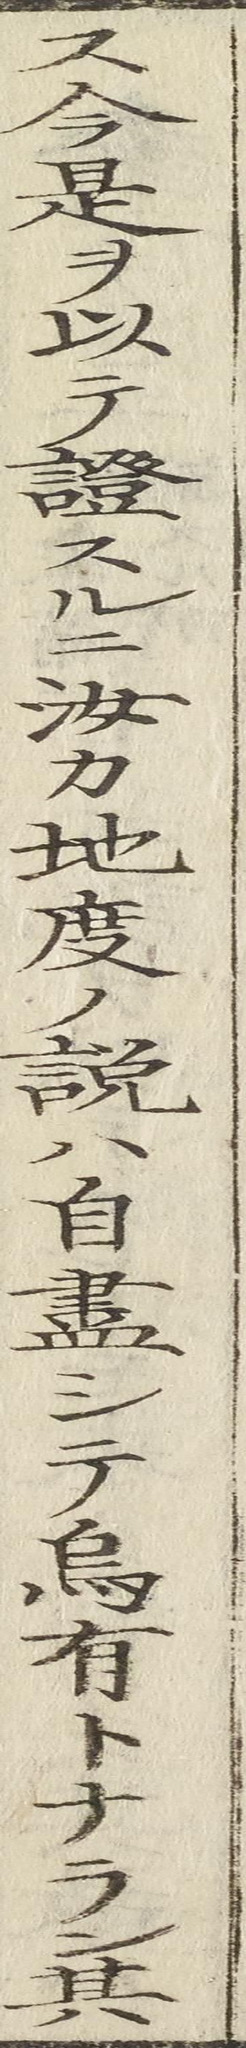ス今是ヲ以テ證スルニ汝カ地度ノ説ハ自尽シテ烏有トナラン其
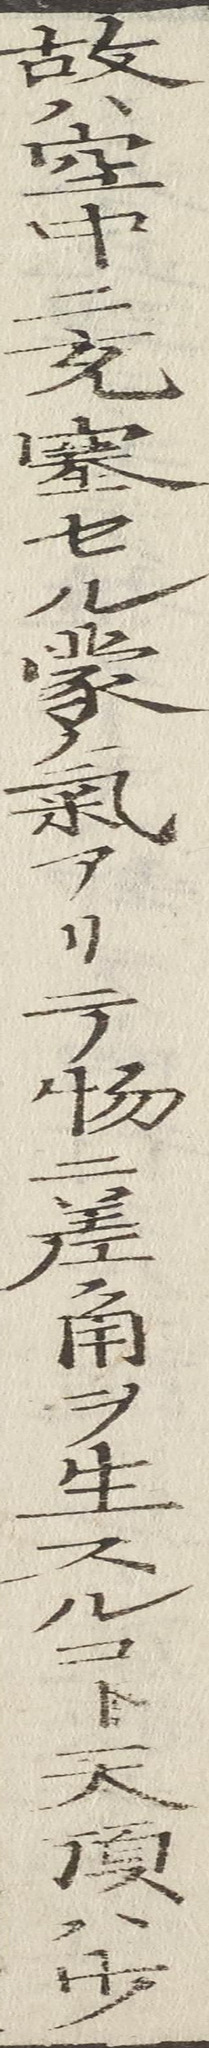故ハ空中ニ充塞セル豪気アリテ物ニ差角ヲ生スルコト天頂ハ少
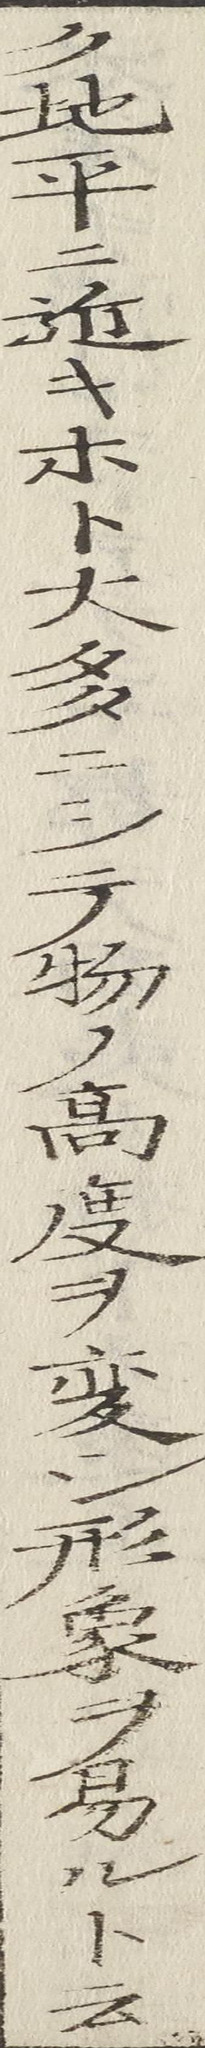ク地平ニ近キホト大多ニシテ物ノ高度ヲ変シ形象ヲ易ルト云
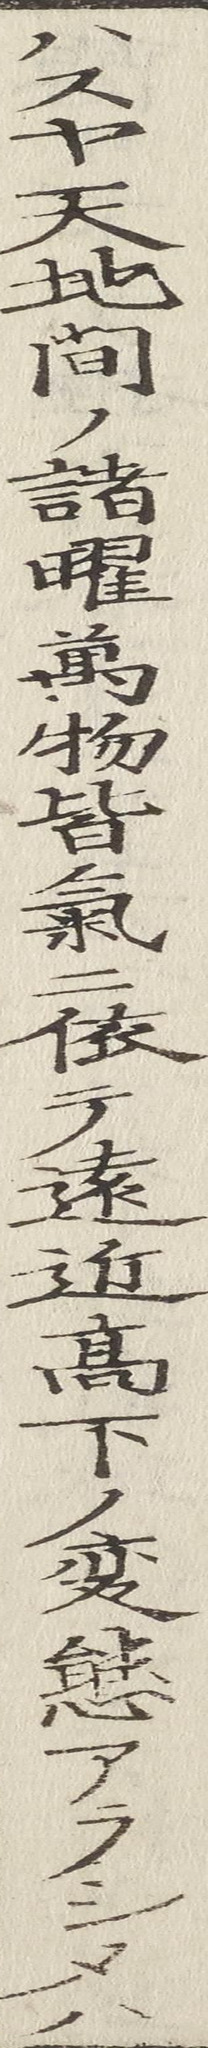ハスヤ天地間ノ諸曜万物皆気ニ依テ遠近高下ノ変態アラシメハ
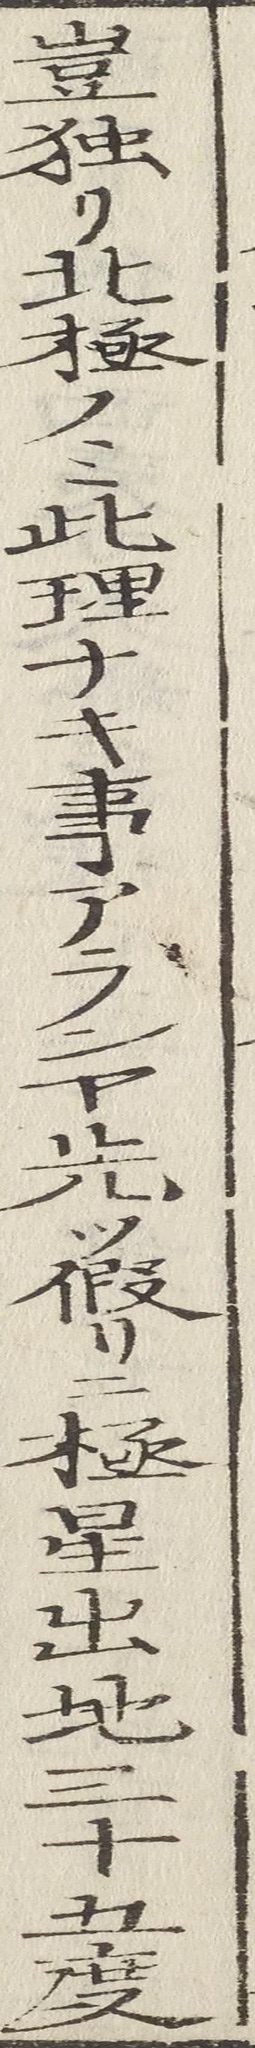豈独リ北極ノミ此理ナキ事アランヤ先ツ仮リニ極星出地三十五度
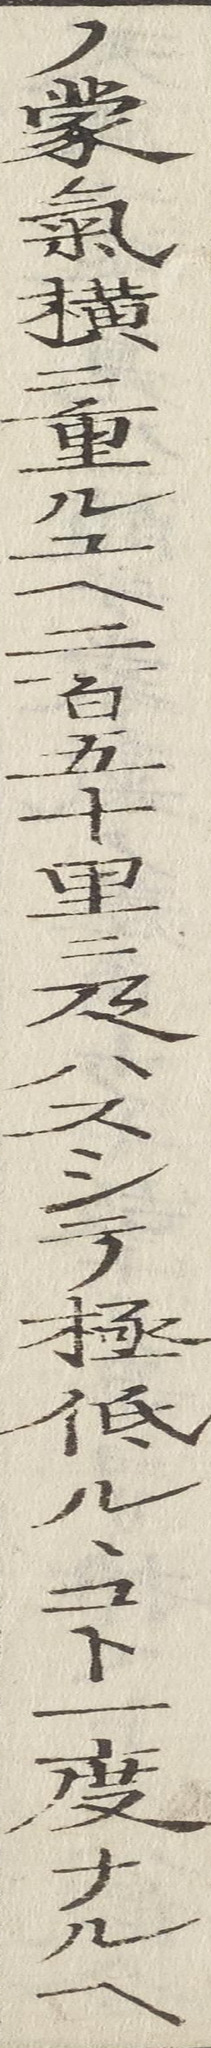ノ豪気横ニ重ルユヘ二百五十里ニ及ハスシテ極低ルヽコト一度ナルヘ
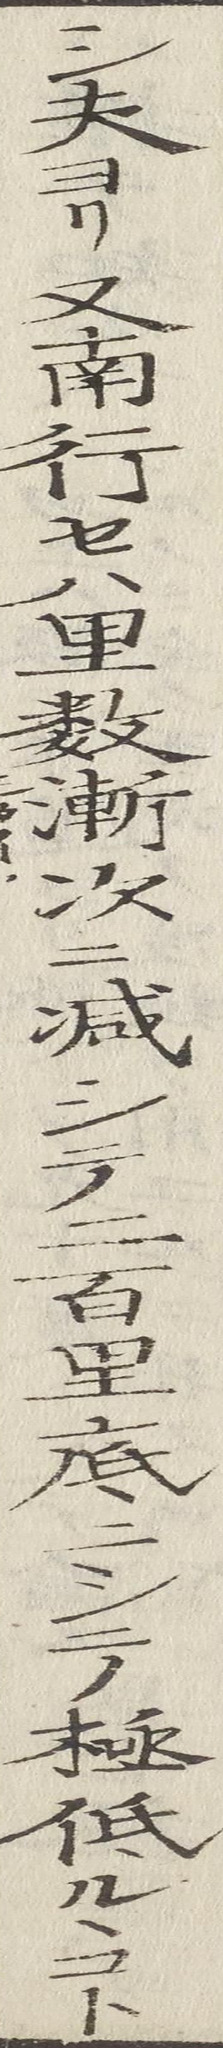シ夫ヨリ又南行セハ里数漸次ニ減シテ二百里底ニシテ極低ルヽコト
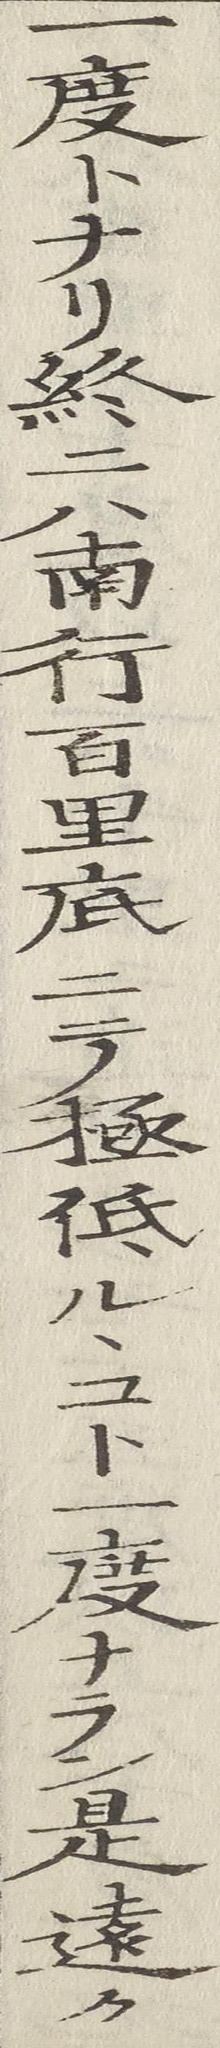一度トナリ終ニハ南行百里底ニテ極低ルヽコト一度ナラン是遠ク
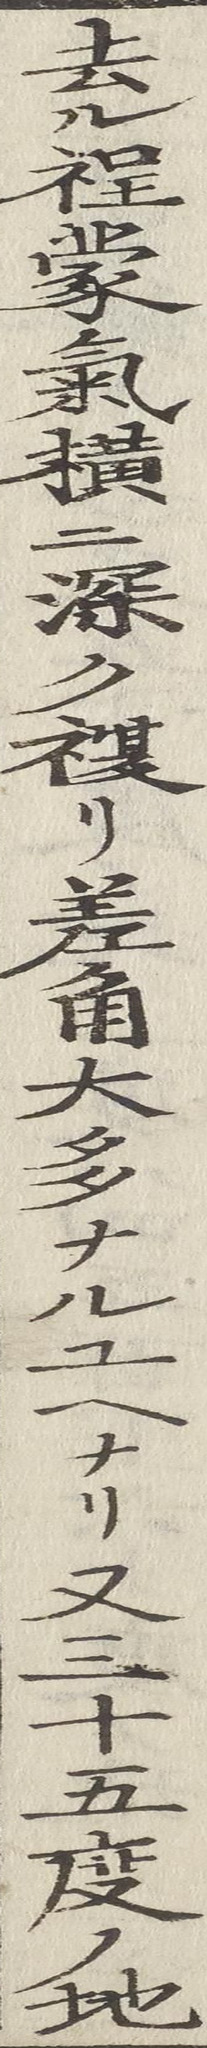去ル程豪気横ニ深ク複リ差角大多ナルユヘナリ又三十五度ノ地
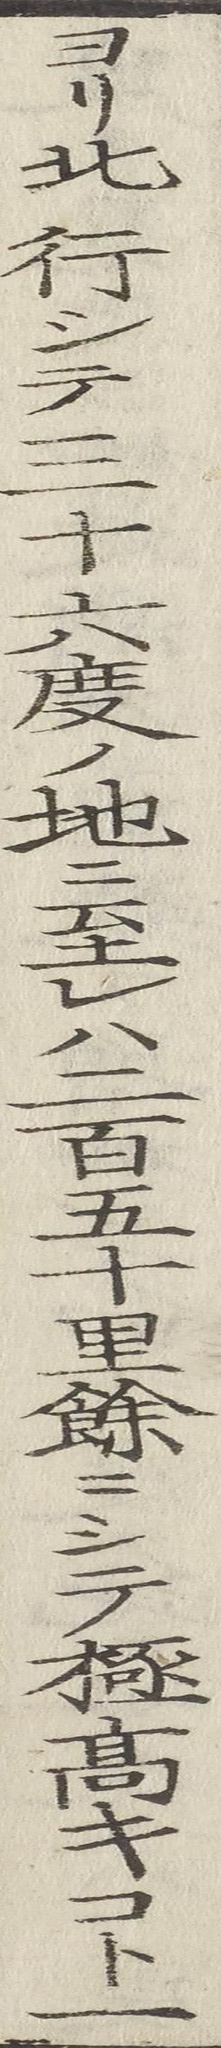ヨリ北行シテ三十六度ノ地ニ至レハ二百五十里余ニシテ極高キコト一

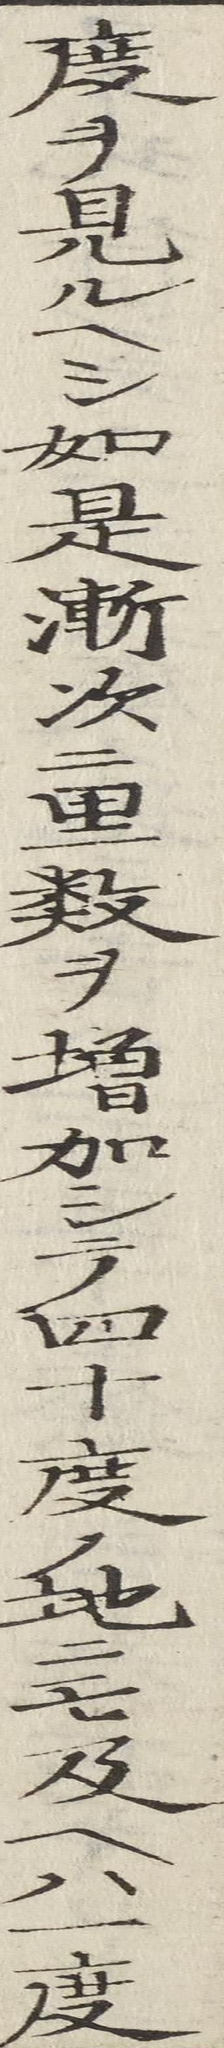度ヲ見ルヘシ如是漸次ニ里数ヲ増加シテ四十度ノ地ニモ及ヘハ一度
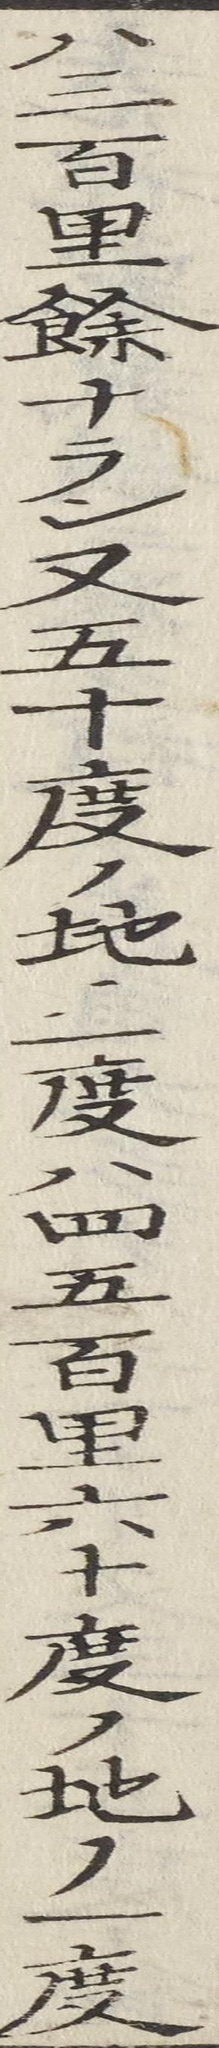ハ三百里余ナラン又五十度ノ地ニ一度ハ四五百里六十度ノ地ノ一度
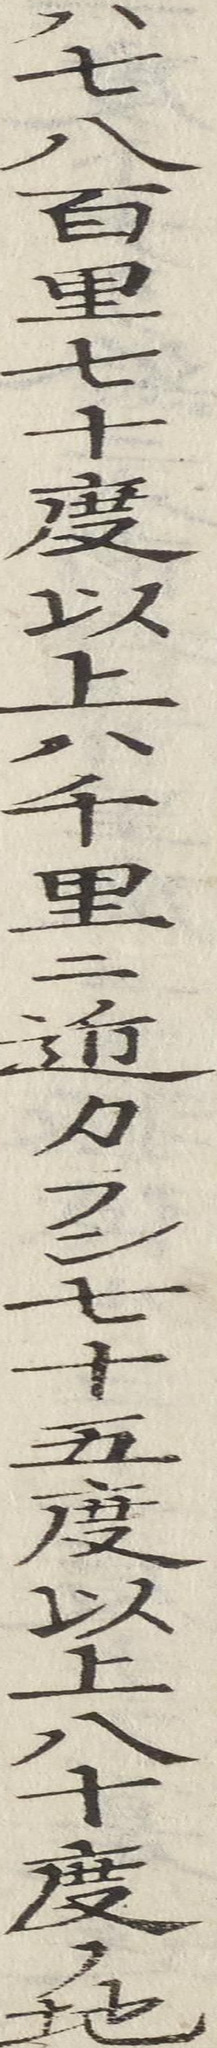ハ七八百里七十度以上ハ千里ニ近カラン七十五度以上八十度ノ地
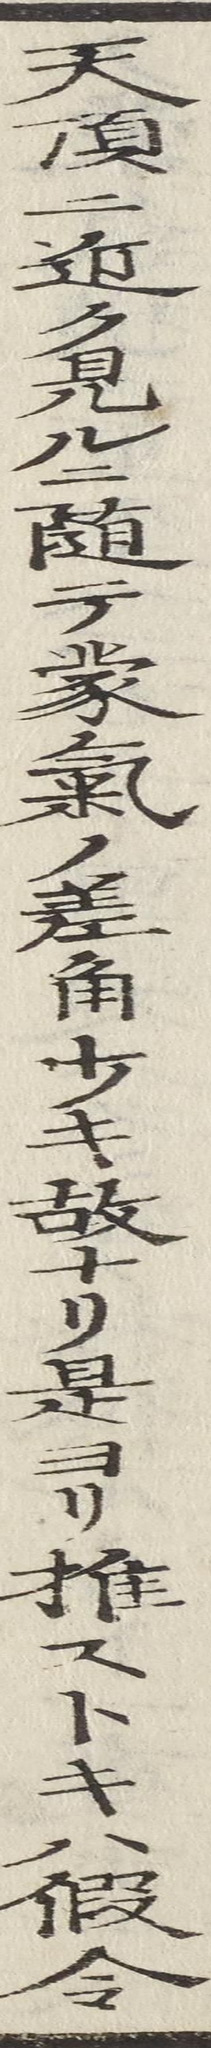天頂ニ近ク見ルニ随テ豪気ノ差角少キ故ナリ是ヨリ推ストキハ仮令
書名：護法新論　二編　中
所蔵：東京大学地震研究所図書室 Earthquake Research Institute Library, The University of Tokyo, JAPAN
